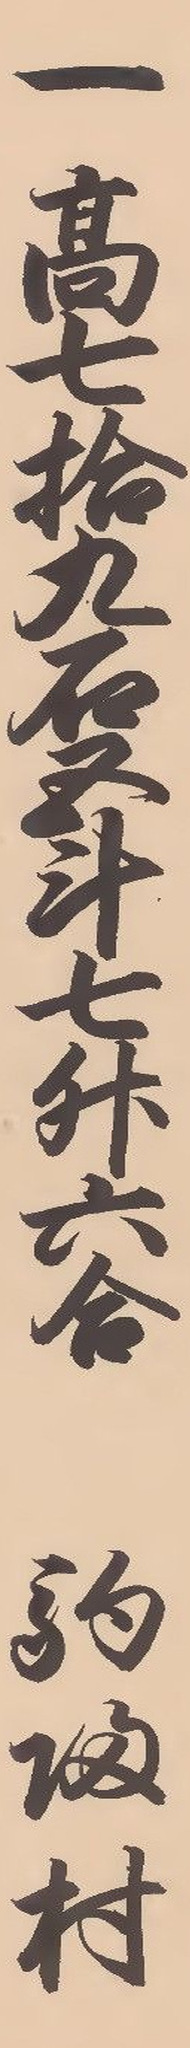一高七拾九石五斗七升六合駒帰村
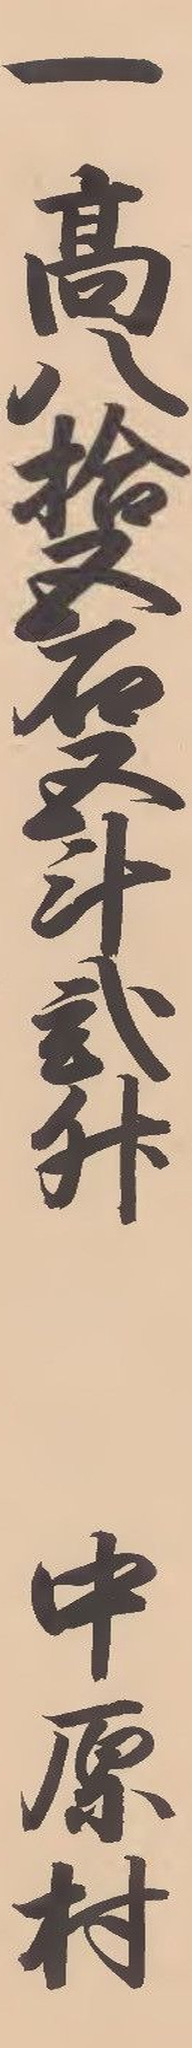一高八拾五石五斗弐升中原村
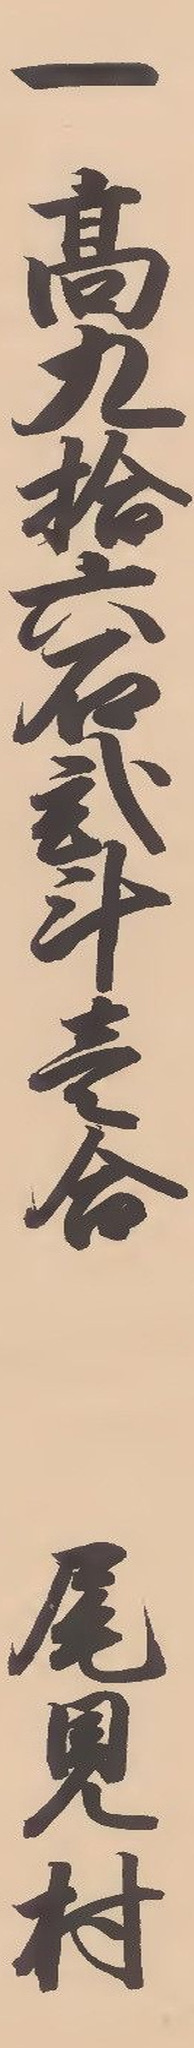一高九拾六石弐斗壱合尾見村
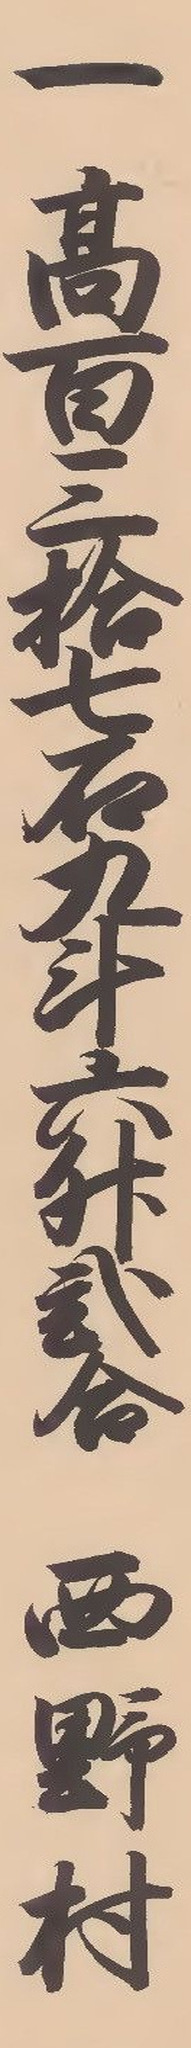一高百三拾七石九斗六升弐合西野村
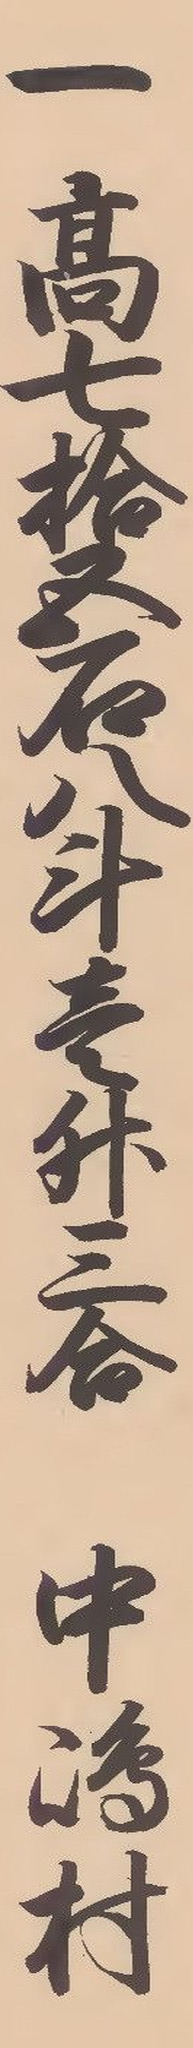一高七拾五石八斗壱升三合中島村

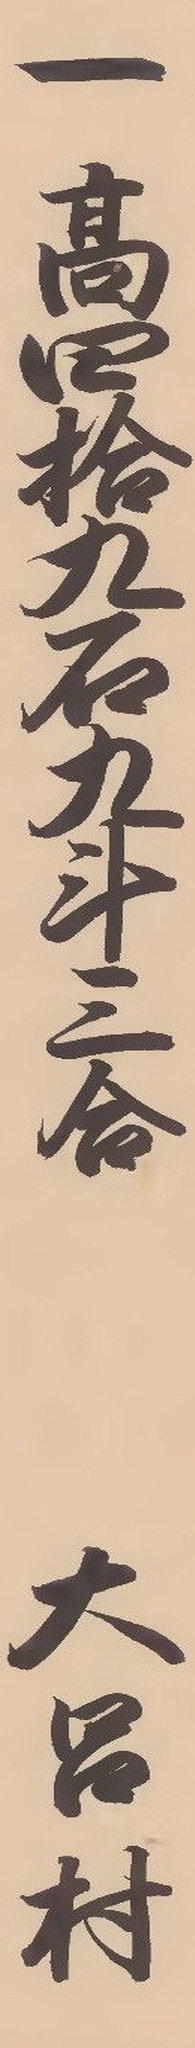一高四拾九石九斗三合大呂村
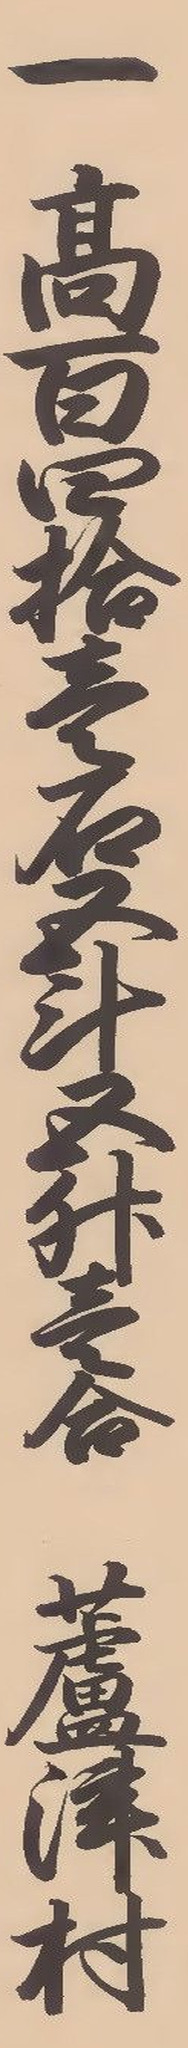一高百四拾壱石五斗五升壱合蘆津村
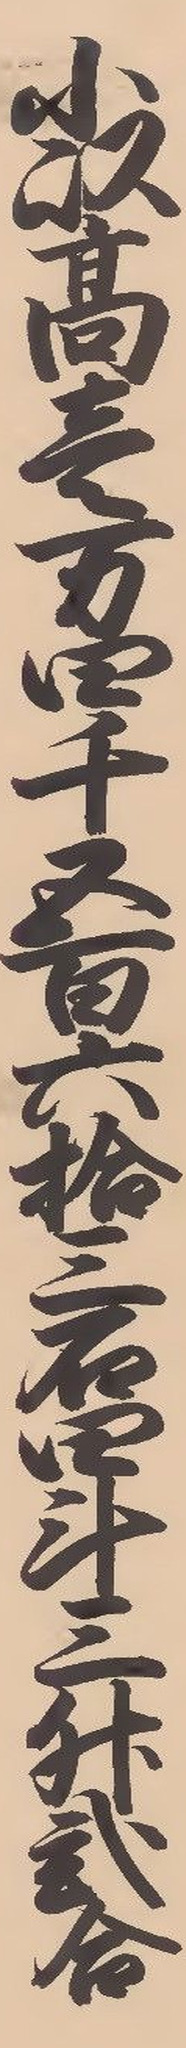小以高壱万四千五百六拾三石四斗三升弐合

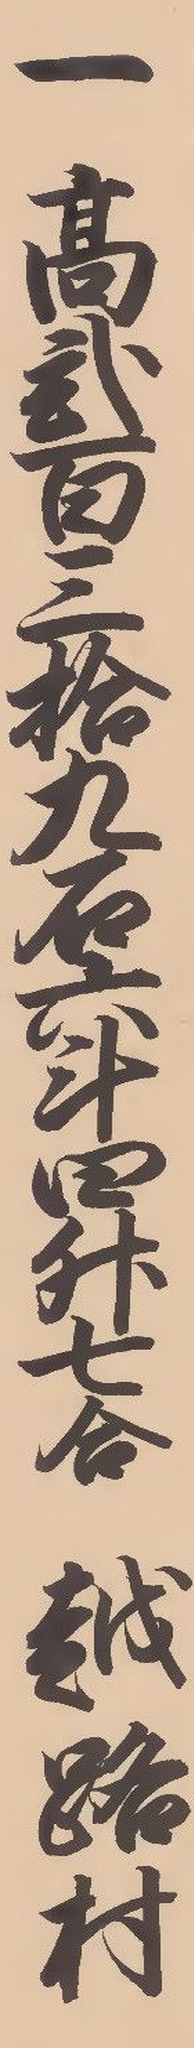一高弐百三拾九石六斗四升七合越路村
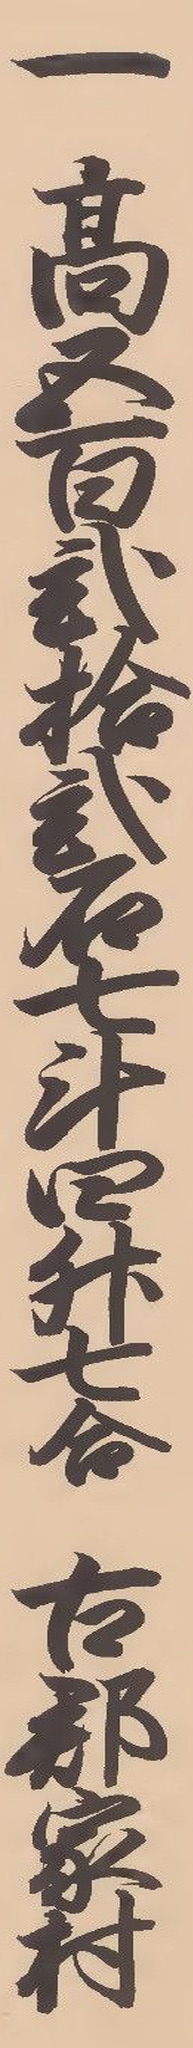一高五百弐拾弐石七斗四升七合古郡家村
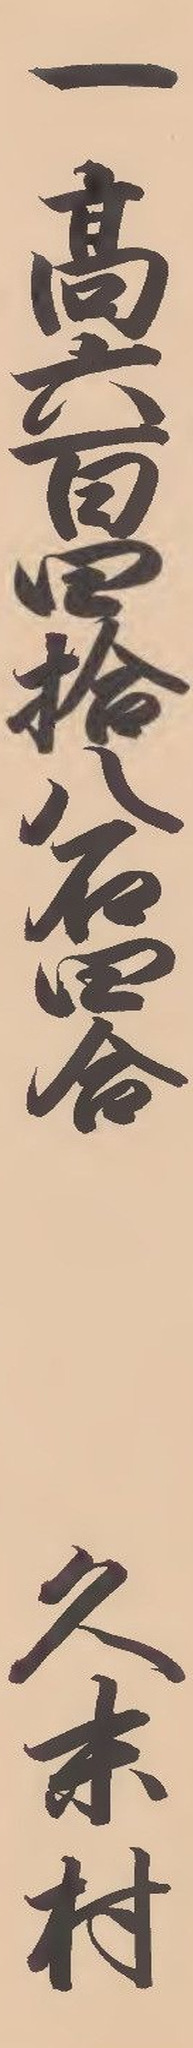一高六百四拾八石四合久末村
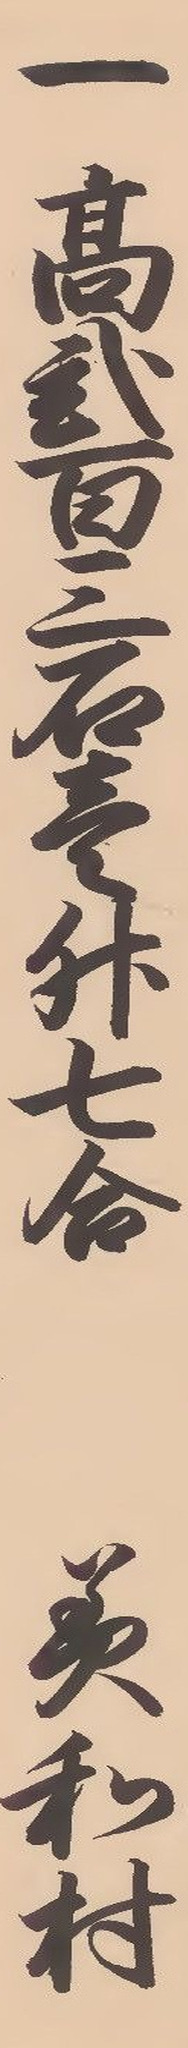一高弐百三石壱升七合美和村
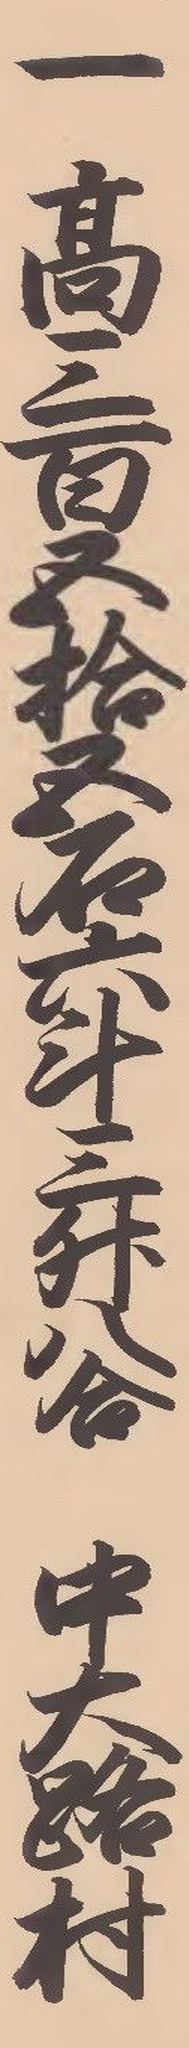一高三百五拾五石六斗三升八合中大路村
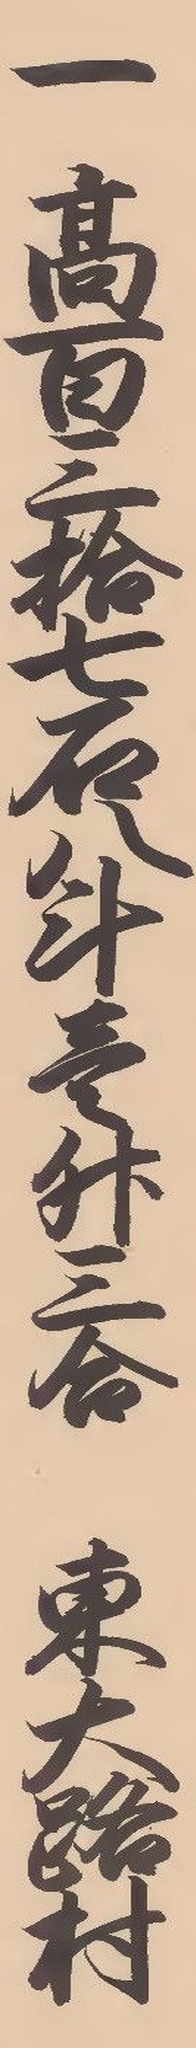一高百三拾七石八斗壱升三合東大路村

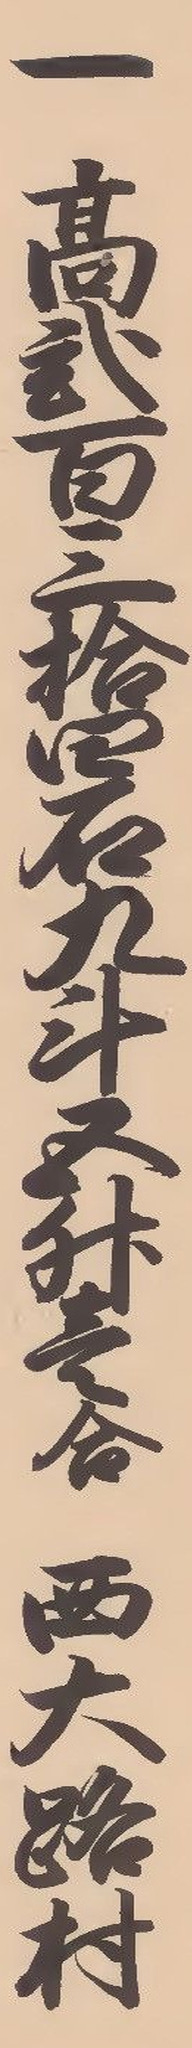一高弐百三拾四石九斗五升壱合西大路村
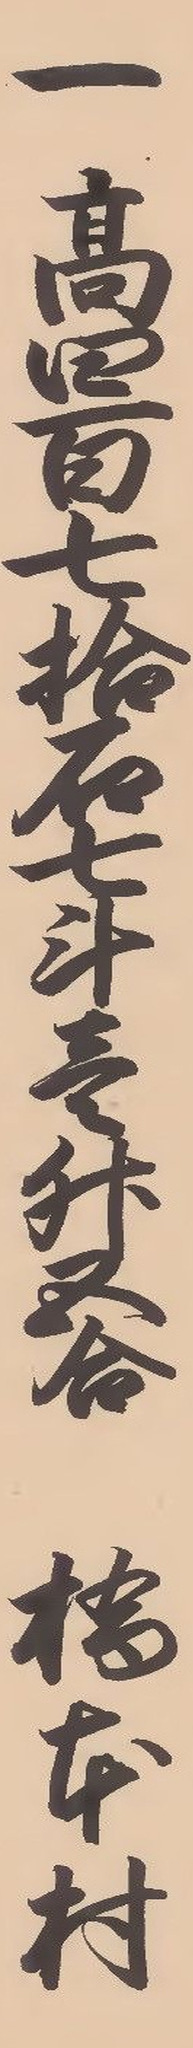一高四百七拾石七斗壱升五合橋本村
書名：因幡国郷帳
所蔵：国立公文書館 National Archives of Japan
